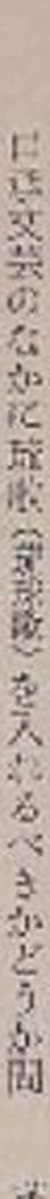口承文芸のなかに琉歌(琉球歌)を入れるべきかどうか問
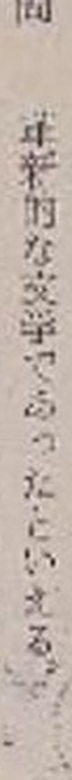革新的な文学であったといえる。
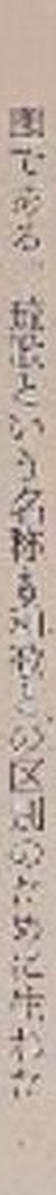題である。琉歌という名称も和歌との区別のために生れた
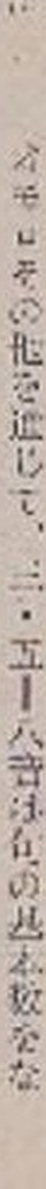オモロその他を通じて、三・五―八音は句の基本数をな
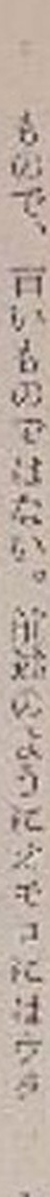もので、古いものではない。前述のようにオモロにはウタ
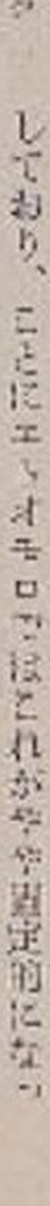しており、ことにエトオモロではこれがやや固定的になっ
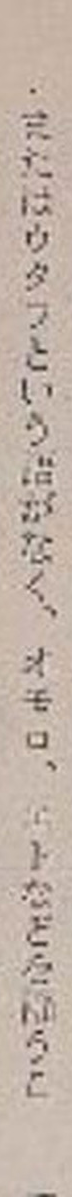またはウタフという語がなく、オモロ、エトなどを謡うこ
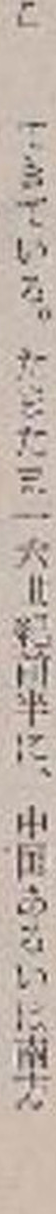てきている。たまたま一六世紀前半に、中国あるいは南方
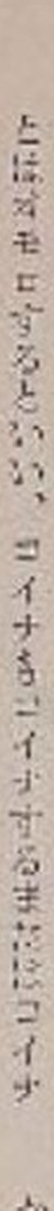とはオモロするといい、コイナもコイナするまたはコイナ
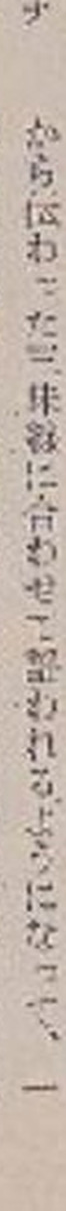から伝わった三味線に合わせて謡われるようになって、一
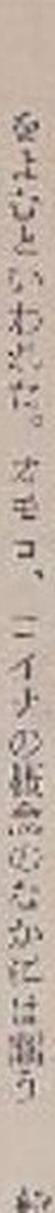をよむといわれた。オモロ、コイナの概念のなかには謡う
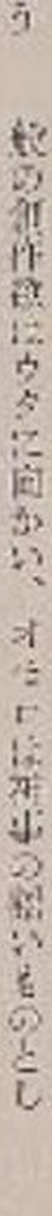般の創作欲はウタに向かい、オモロは事の謡いものとし
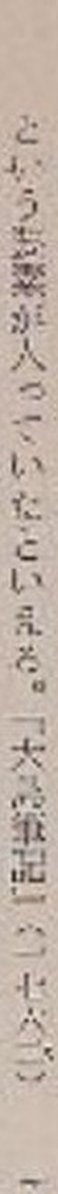という要素が入っていたといえる。『大島筆記』(一七六二)
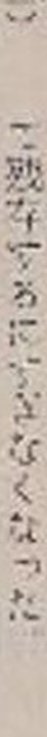て残存するにすぎなくなった。
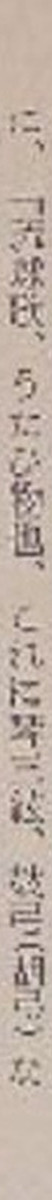に、「琉球歌、うたひ物也、これに琴三絃、鼓弓(胡弓)な
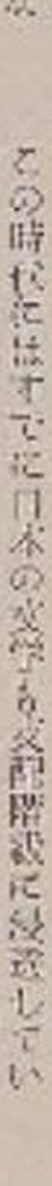この時代にはすでに日本の文学も支配階級に浸透してい
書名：沖縄口承文芸
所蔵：University of the Ryukyus Library
